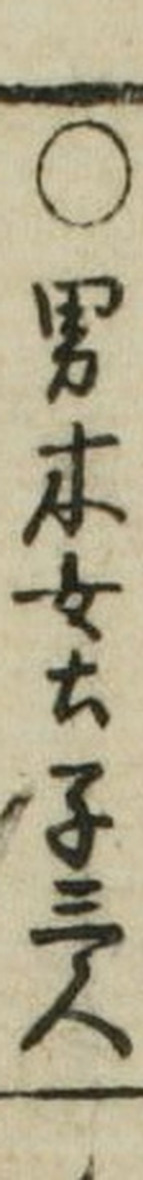○男木女土子三人
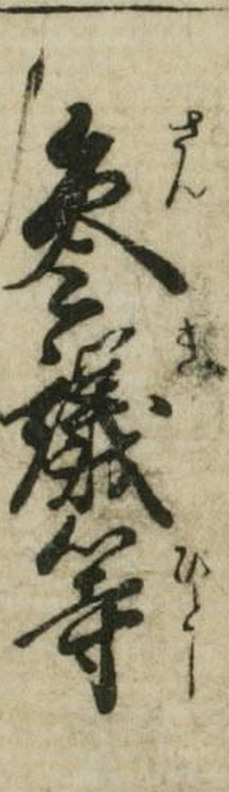参議等
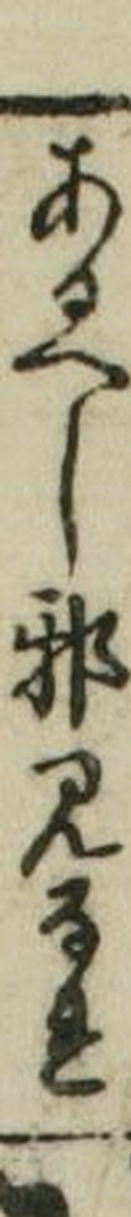あるへし邪見なれ
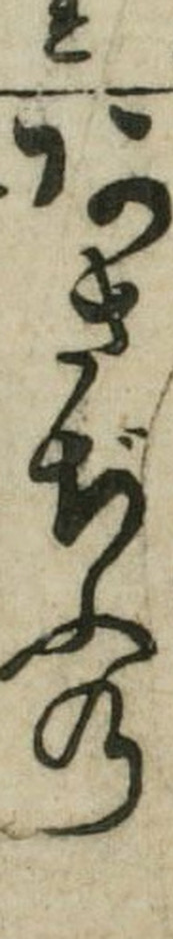あさぢふの
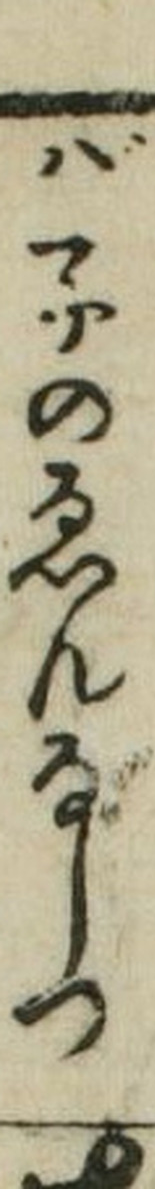ば子のゑんなしつ
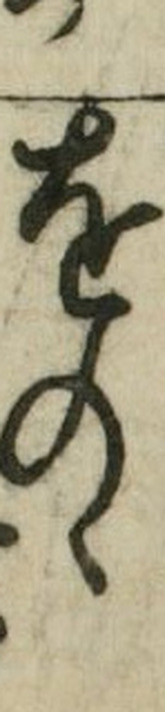をのゝ
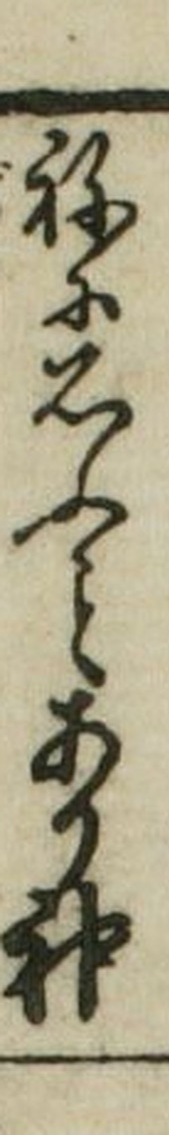ねに石ふみあり神
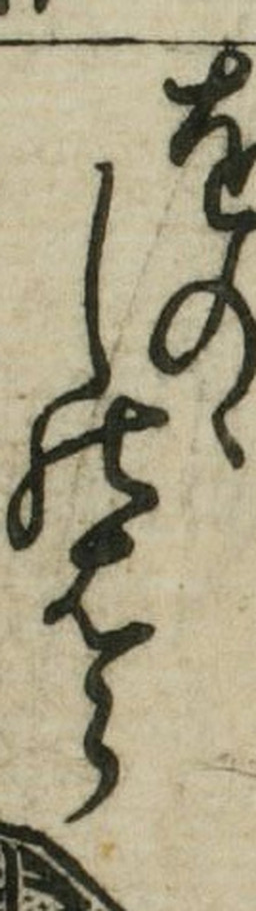しのはら
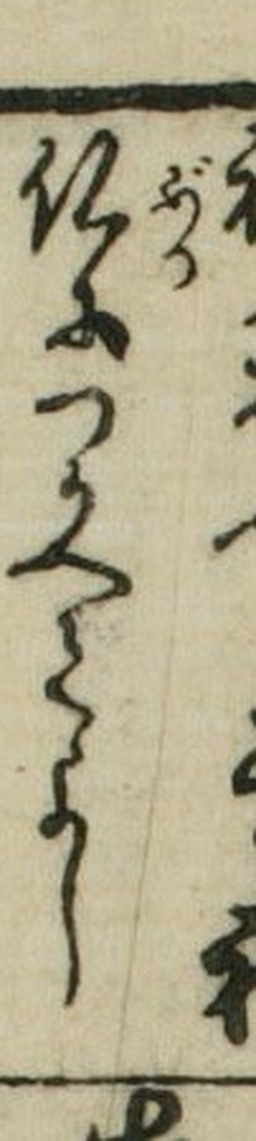仏につかへてよし
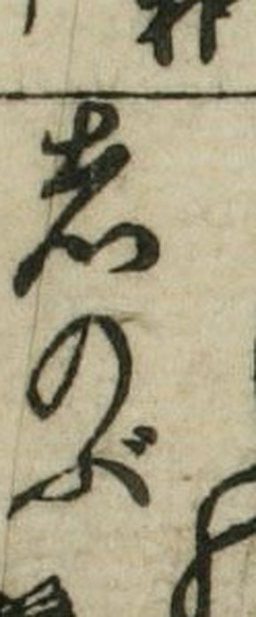しのぶ
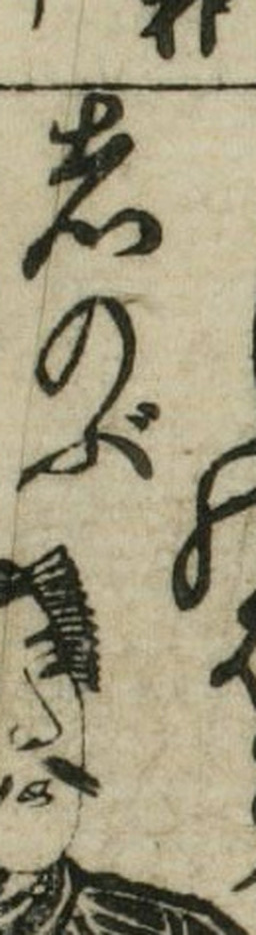しのぶ
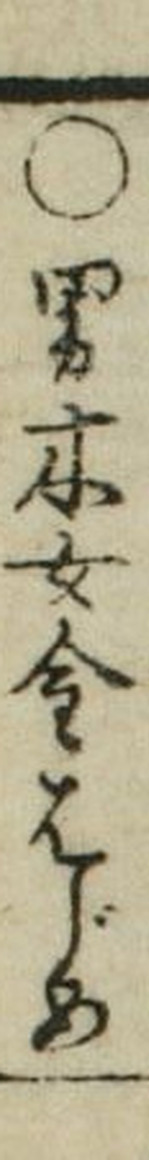○男木女金はじめ
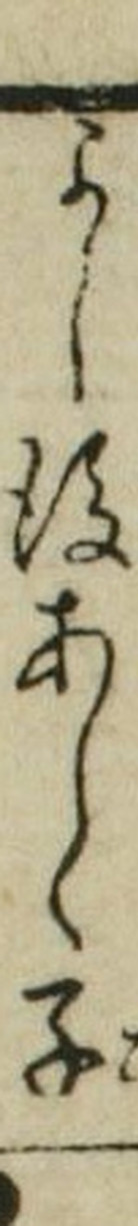よし後あしく子
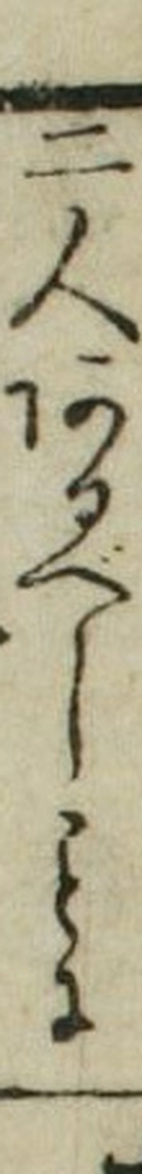二人あるべしことに
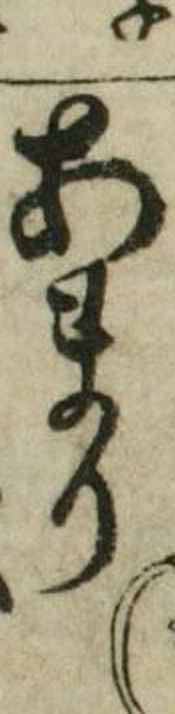あまり
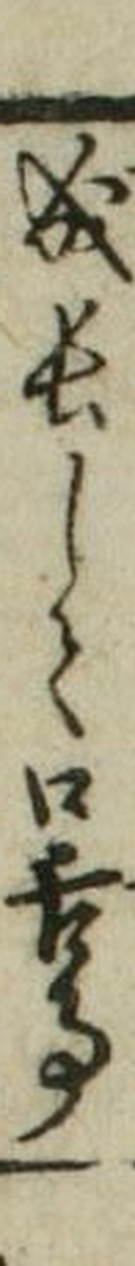成長して口舌事
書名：百人一首
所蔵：東京学芸大学教育コンテンツアーカイブ
